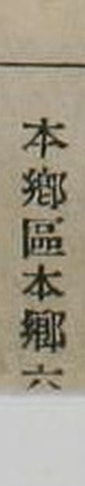本郷区本郷六
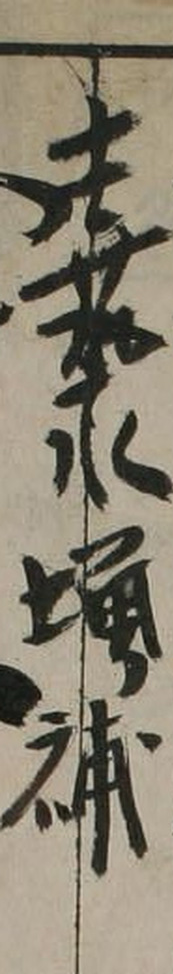嘉永増補
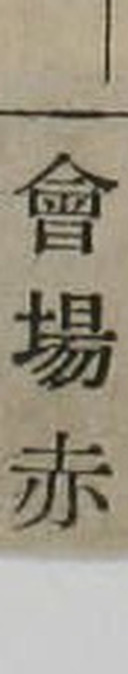会場赤
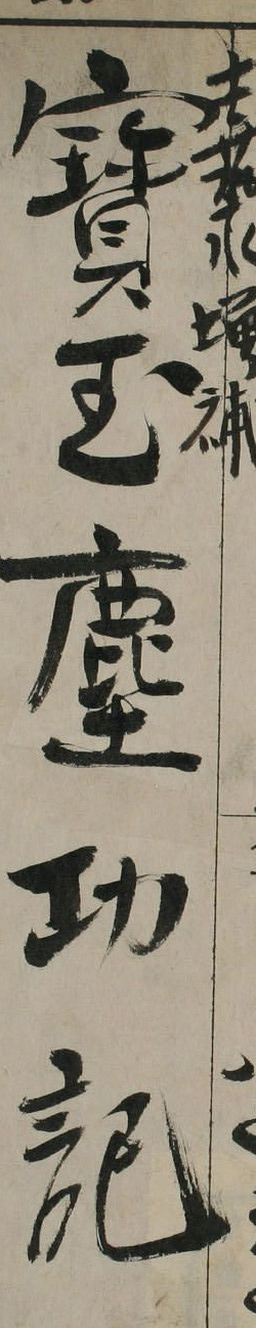宝玉塵功記
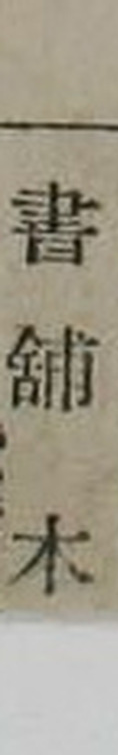書舗木
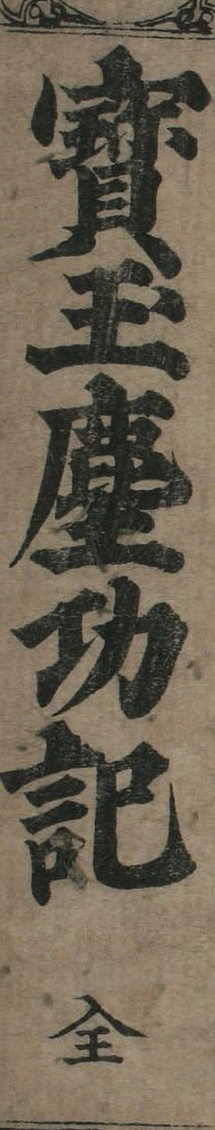宝玉塵功記

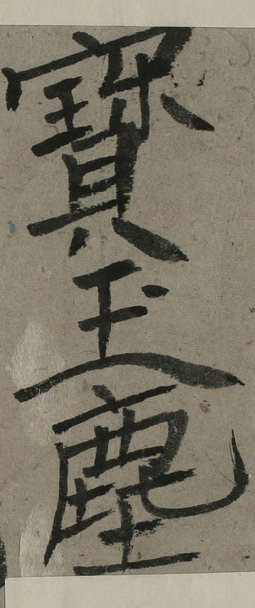宝玉塵

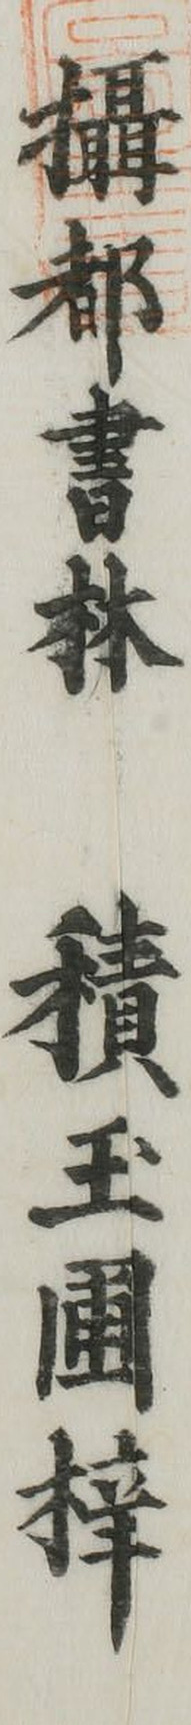補摂都書林積玉圃梓
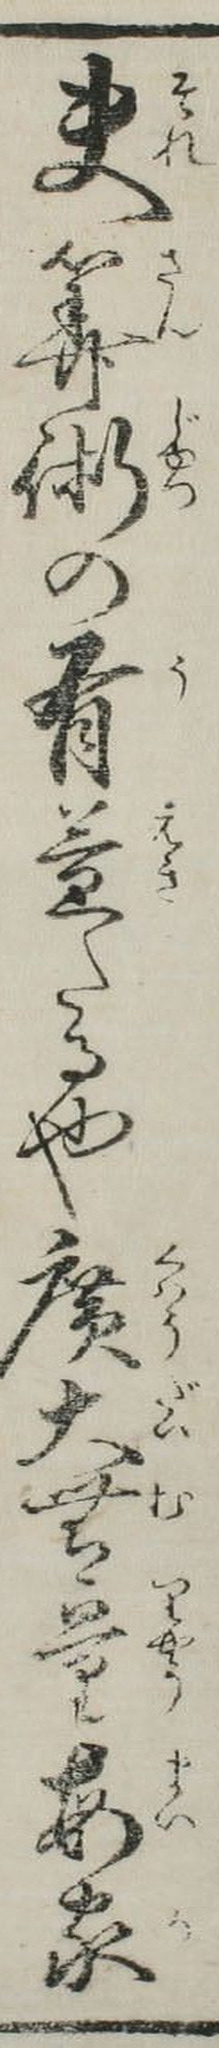夫算術の有益たるや広大無量毎家
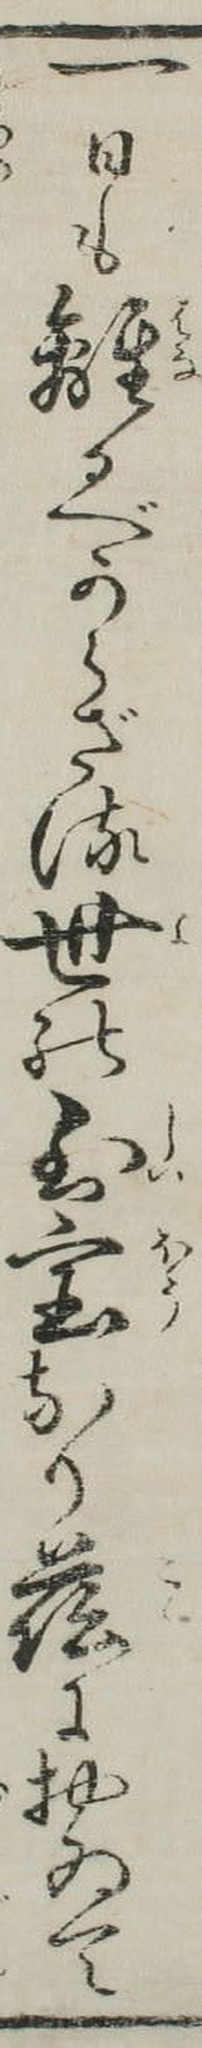一日も離るべからざる世の至宝なり玆におゐて
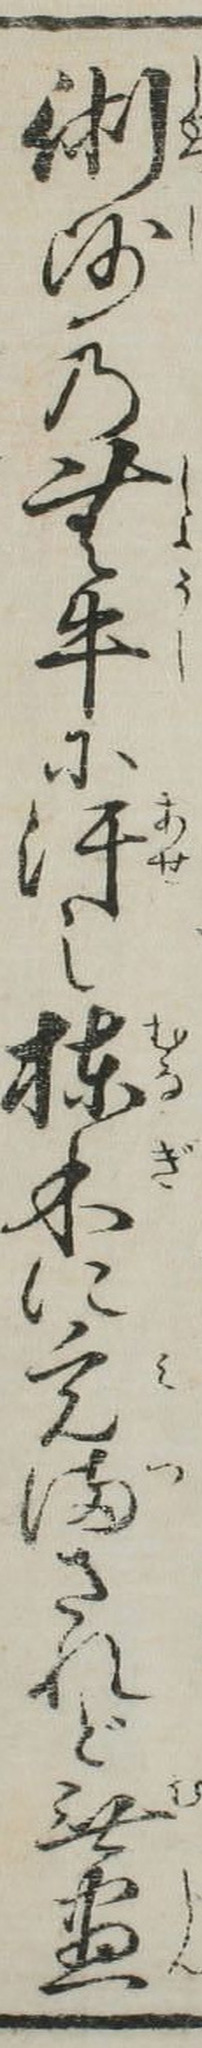術師の生牛に汗し棟木に充満されど無尽
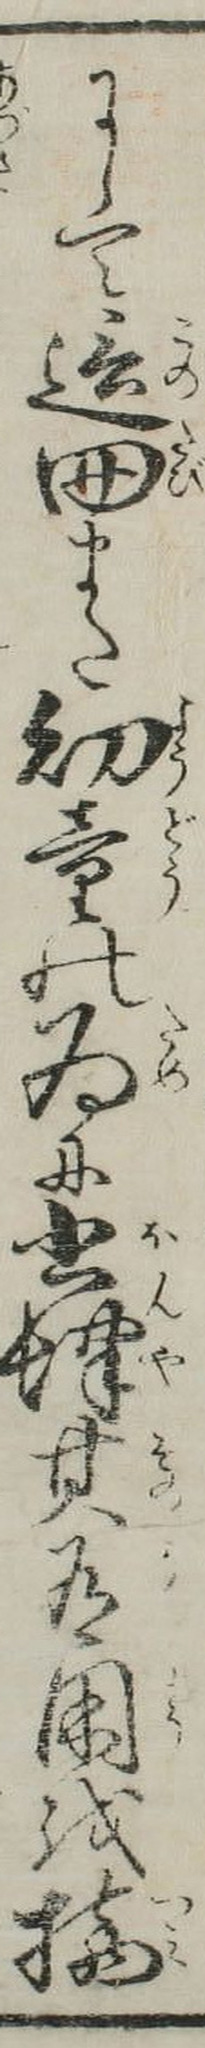にして這回また幼童の為に書肆其有用を摘
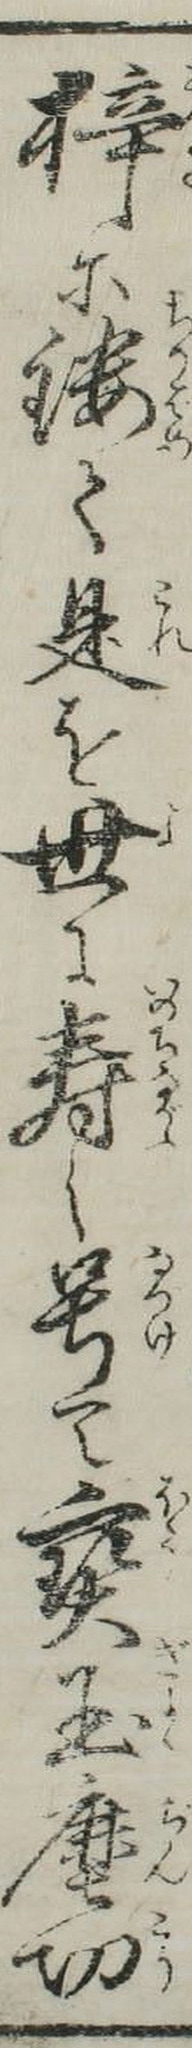梓に鏤て是を世に寿し号て宝玉塵功
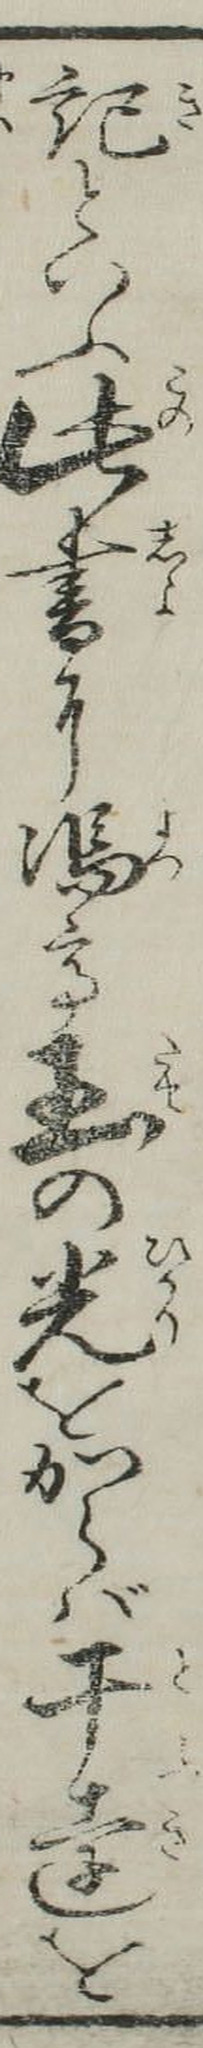記といふ此書に馮て玉の光を加らば于遠を
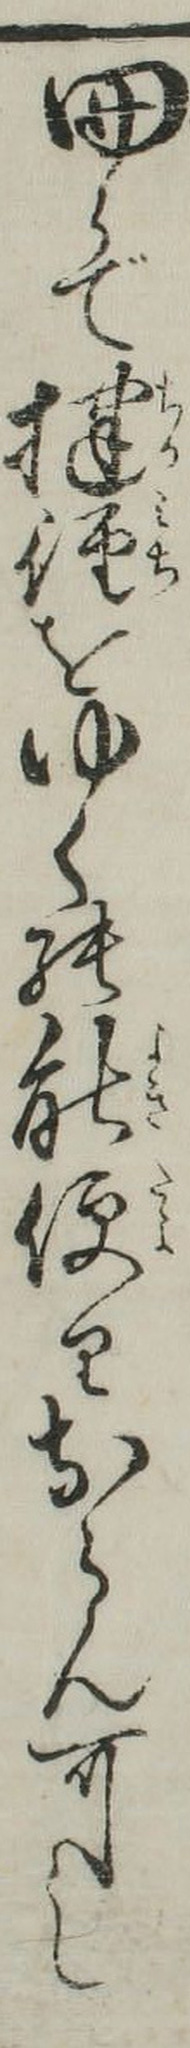回らで捷径をゆくの能便りならん可し
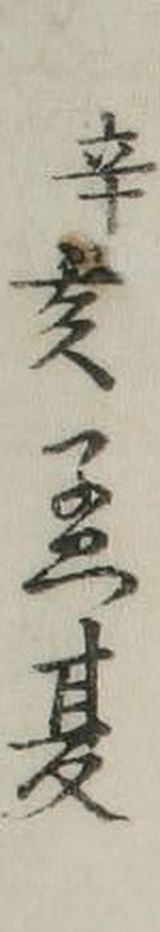辛亥孟夏
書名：宝玉塵劫記
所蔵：東京学芸大学教育コンテンツアーカイブ
